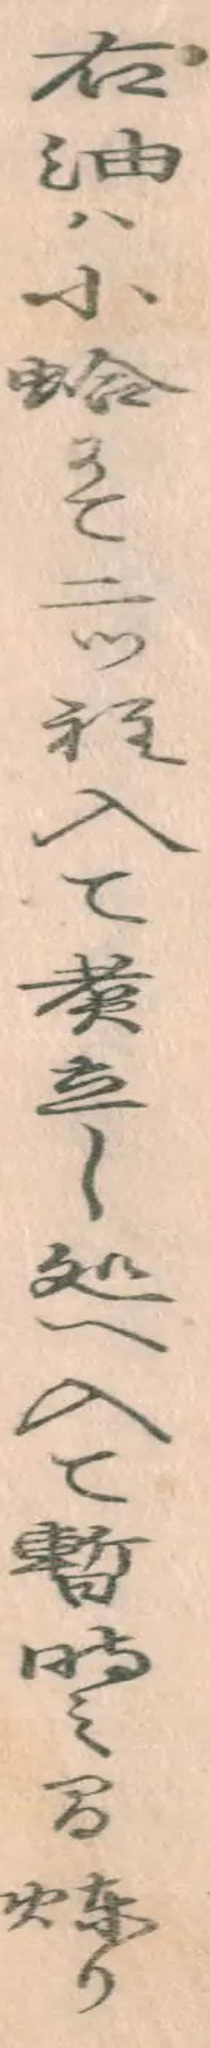右油は小蛤にて二ッ程入て煮立し処へ入て暫時之間煉り
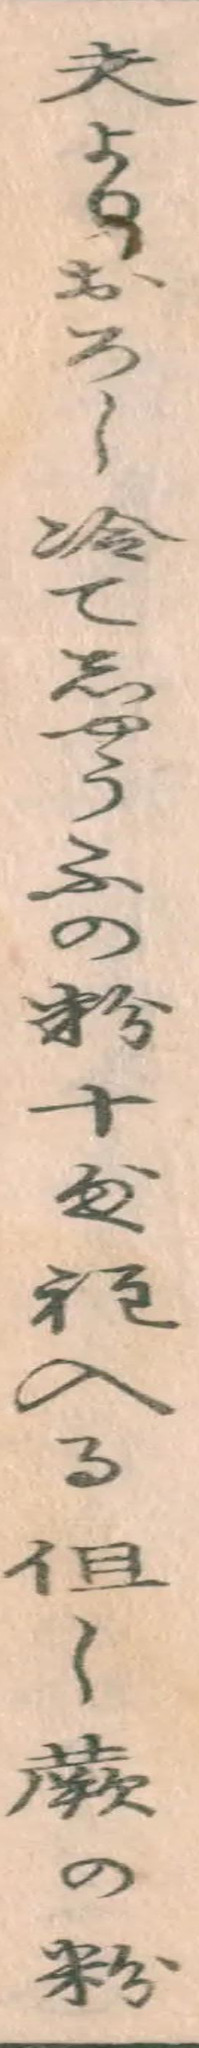夫よりおろし冷てしやうふの粉十匁程入る但し蕨の粉
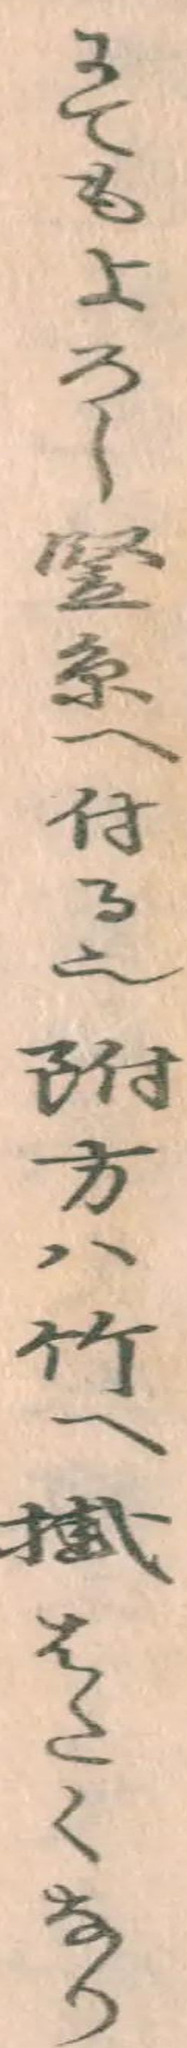にてもよろし竪糸へ付る也附方は竹へ掛はたくなり
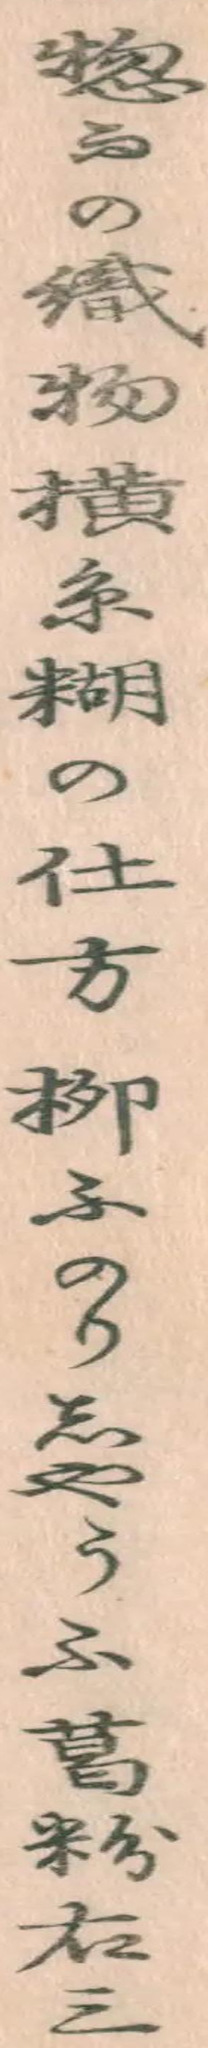一惣ての織物横糸糊の仕方柳ふのりしやうふ葛粉右三
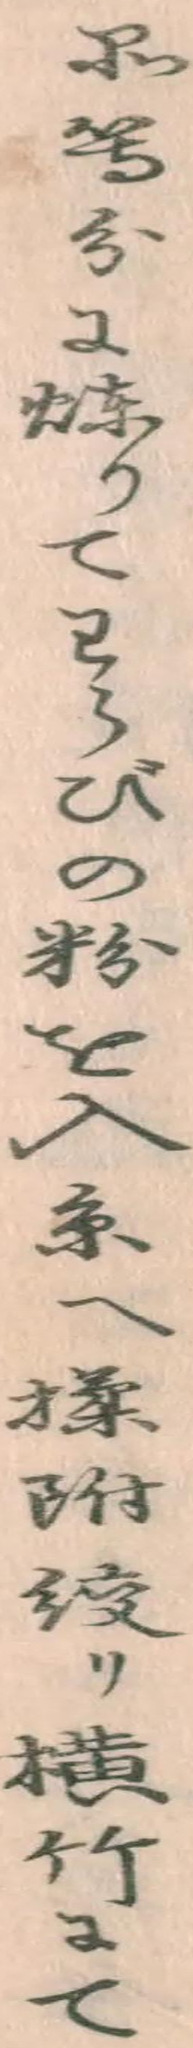品等分に煉りてわらびの粉を入糸へ揉附絞り横竹にて
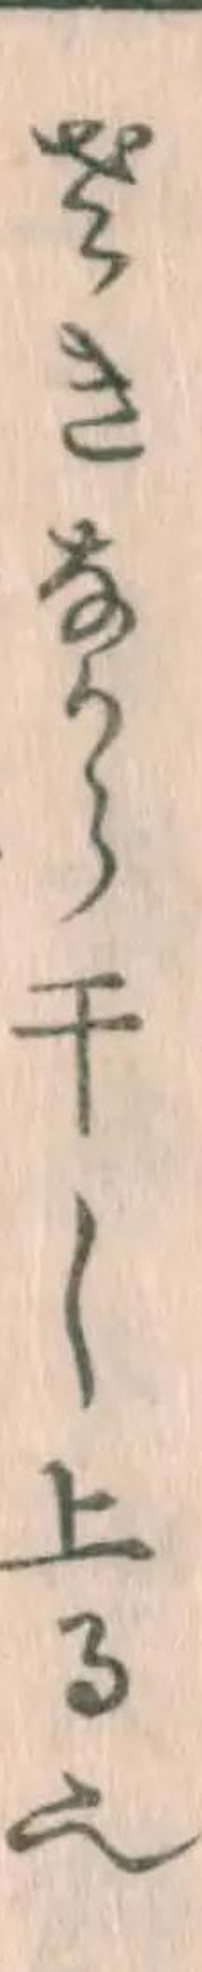さきなから干し上る也
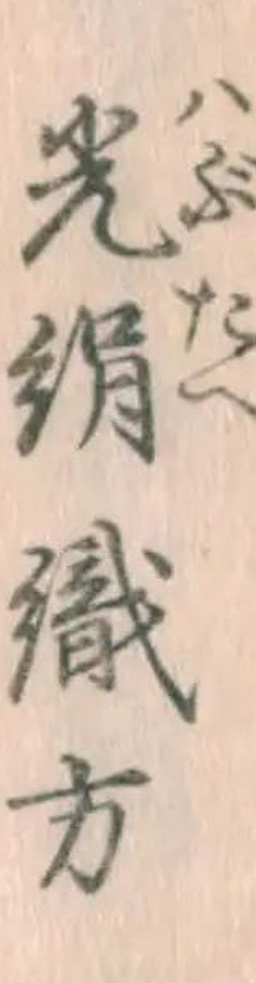光絹織方
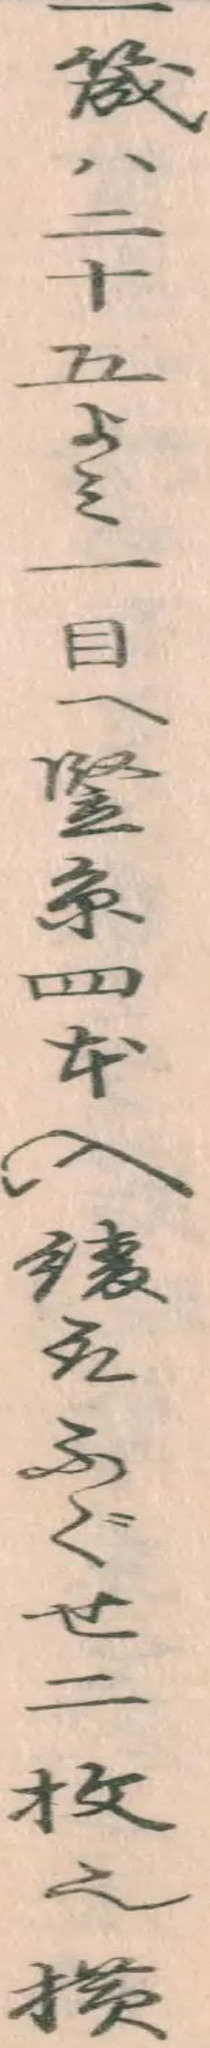一筬は二十五よみ一目へ竪糸四本入綾取ふぐせ二枚也横
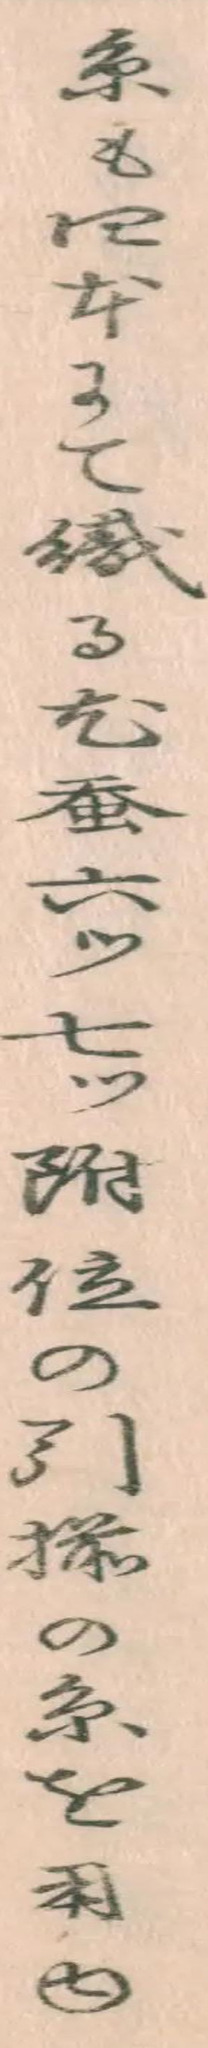糸も四本にて織る尤蚕六ッ七ッ附位の引揃の糸を用ゆ
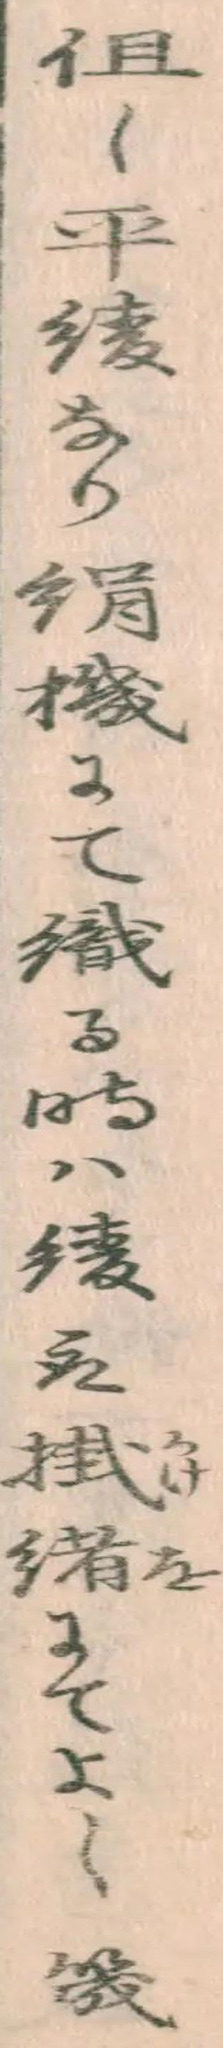但し平綾なり絹機にて織る時は綾取掛緒にてよし筬
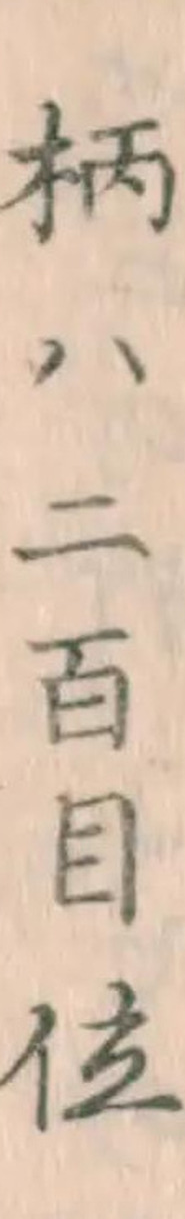柄は二百目位
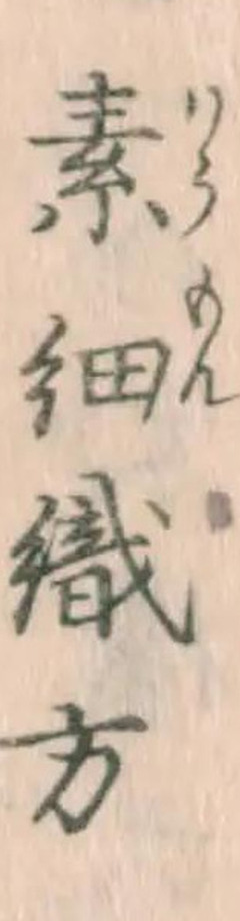素細織方
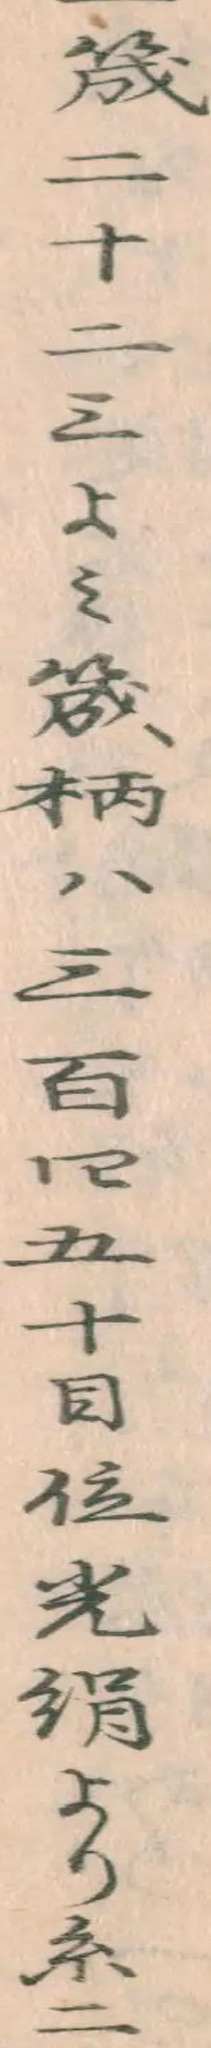一筬二十二三よみ筬柄は三百四五十目位光絹より糸二
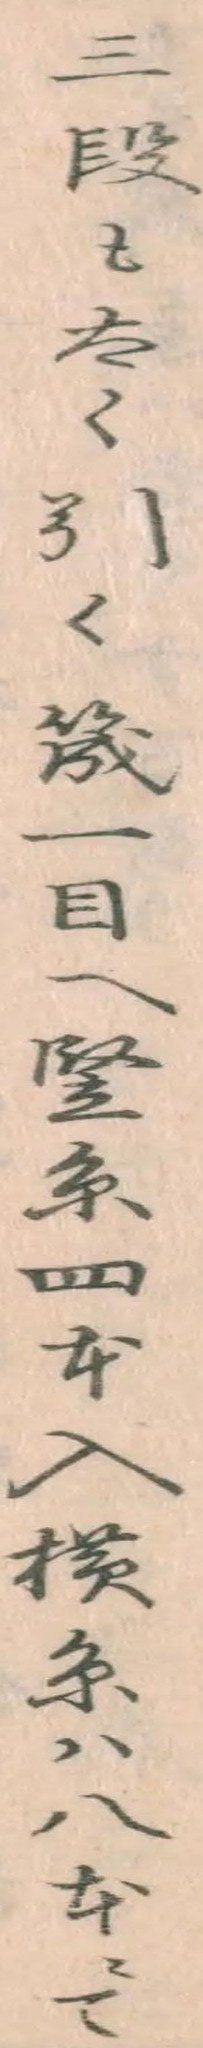三段も太く引く筬一目へ竪糸四本入横糸は八本にて
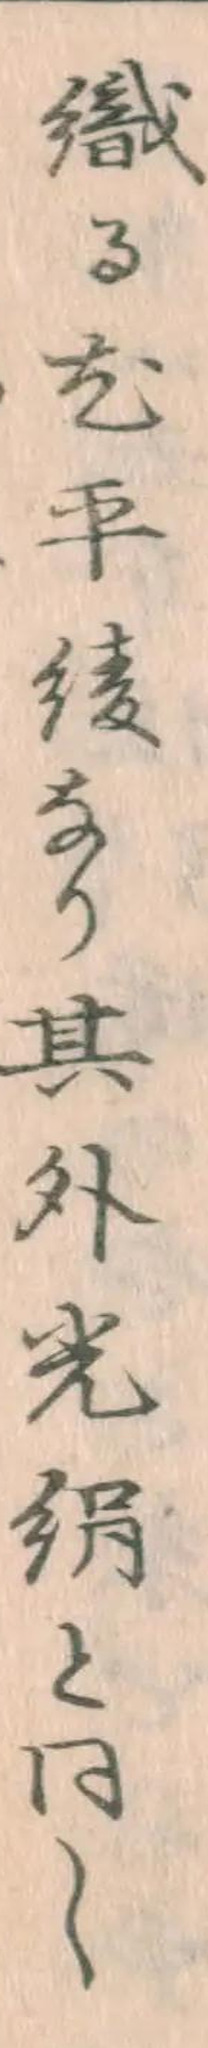織る尤平綾なり其外光絹と同し
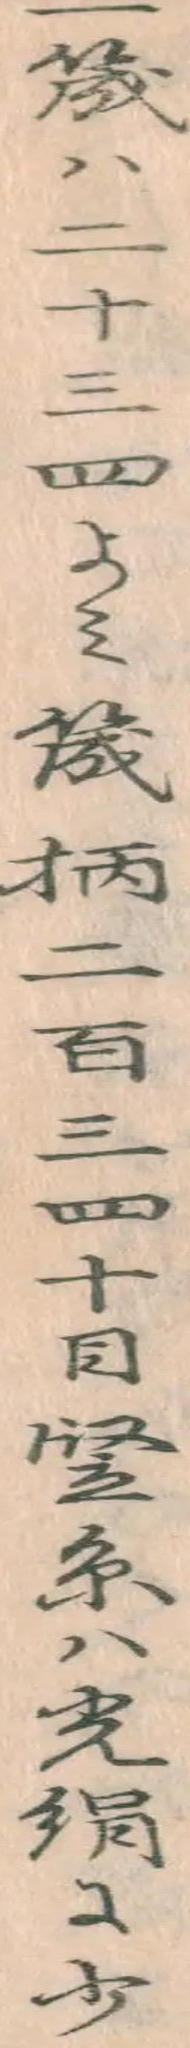一筬は二十三四よみ筬柄二百三四十目竪糸は光絹に少
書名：機織彙編 5巻. [2]
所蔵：国立国会図書館 National Diet Library, JAPAN
